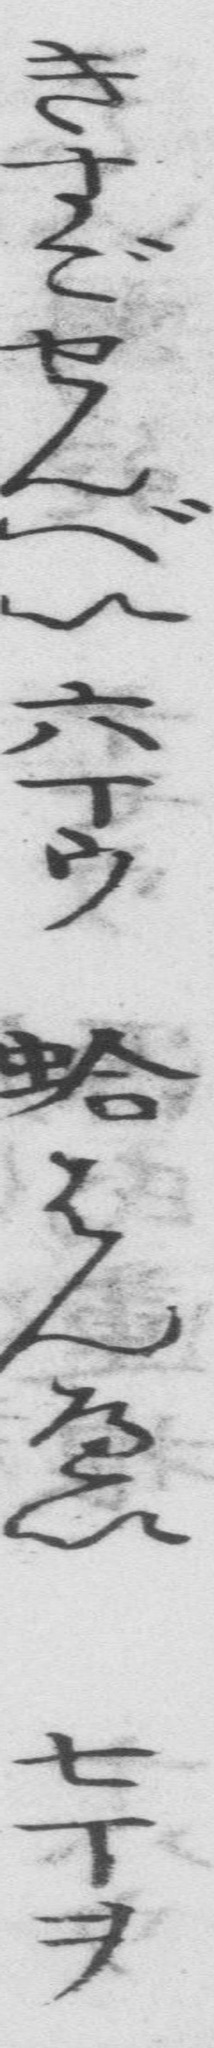きすごせんべい六丁ウ蛤はんへい七丁ヲ
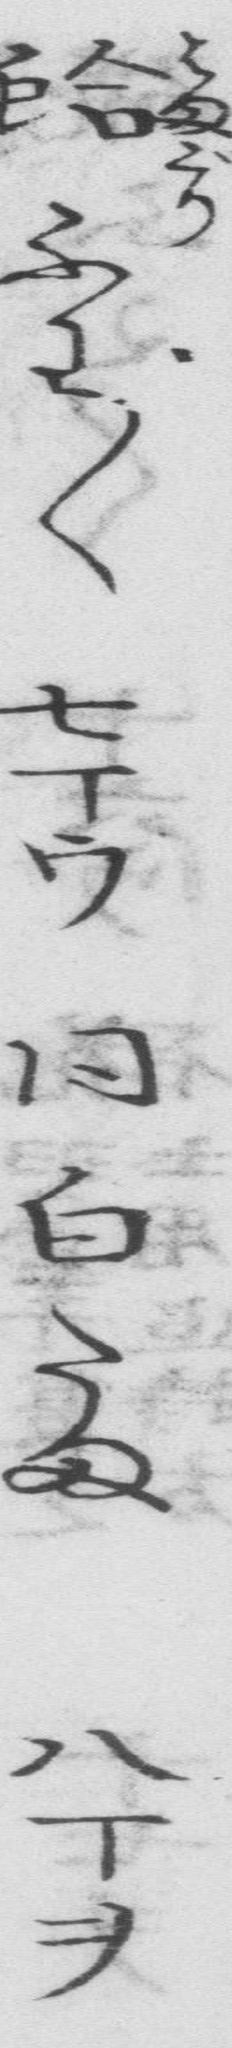蛤ふわ〳〵七丁ウ同白たま八丁ヲ
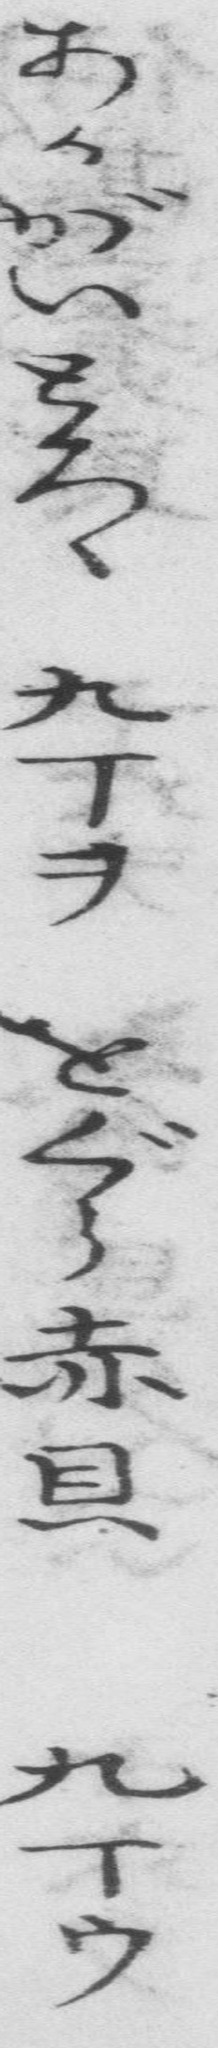あかがいとろゝ九丁ヲをぐら赤貝九丁ウ
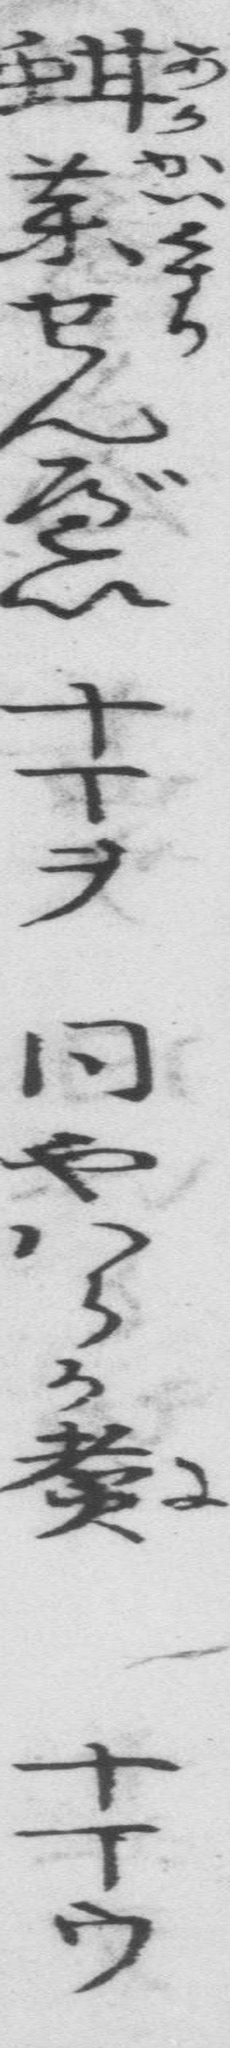蚶薬せんべい十丁ヲ同やはらか煮十丁ウ
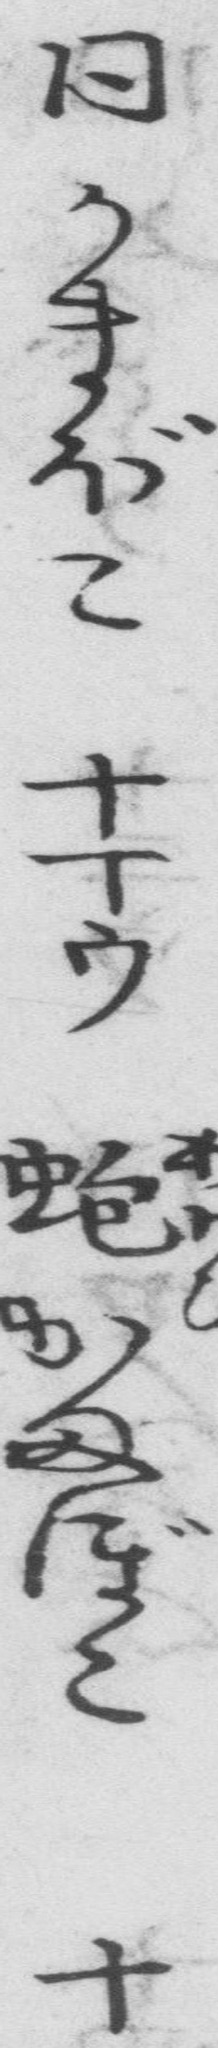同かまぼこ十丁ウ鮑かまぼこ十一ウ
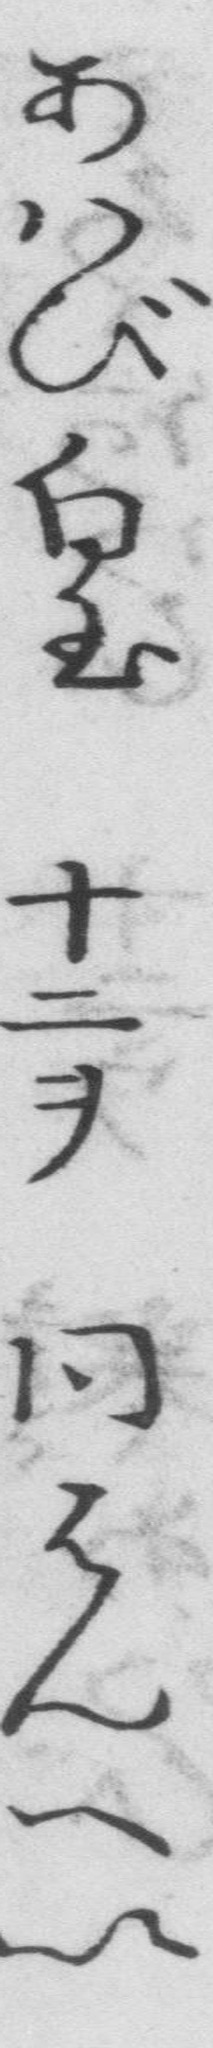あはび白玉十二ヲ同はんへい同

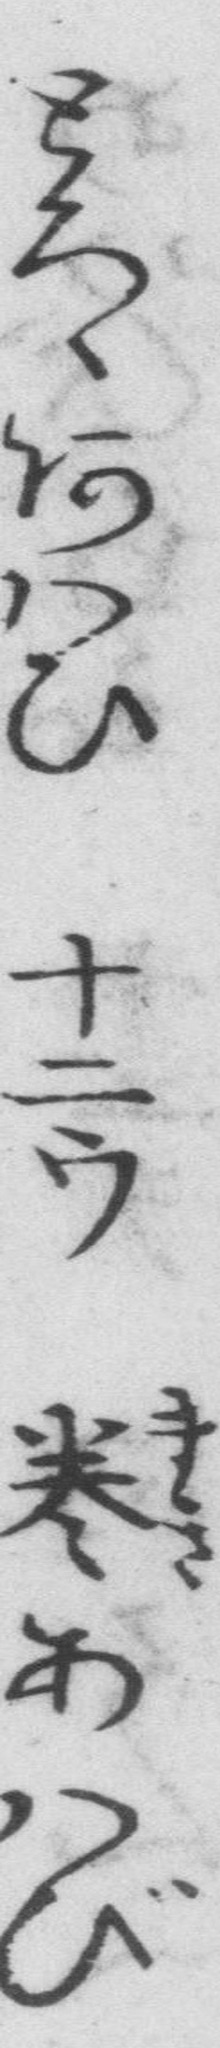とろゝあはひ十二ウ巻あはび同
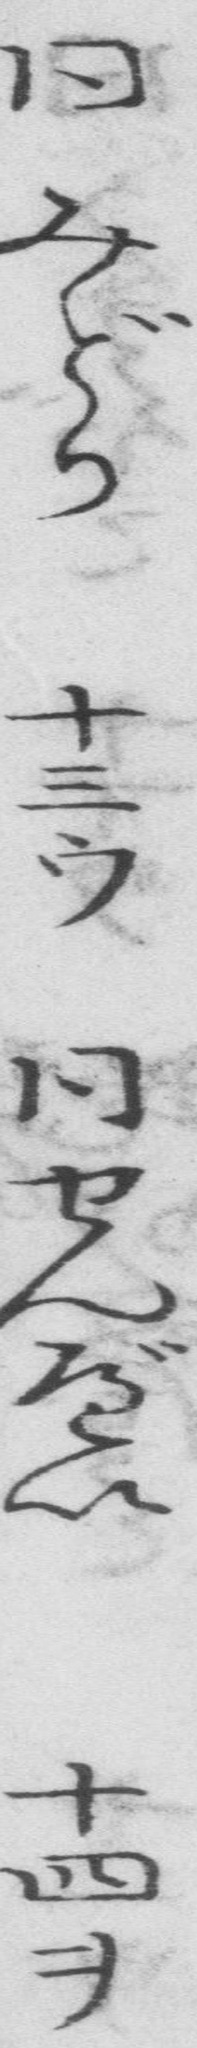同みどり十三ウ同せんべい十四ヲ
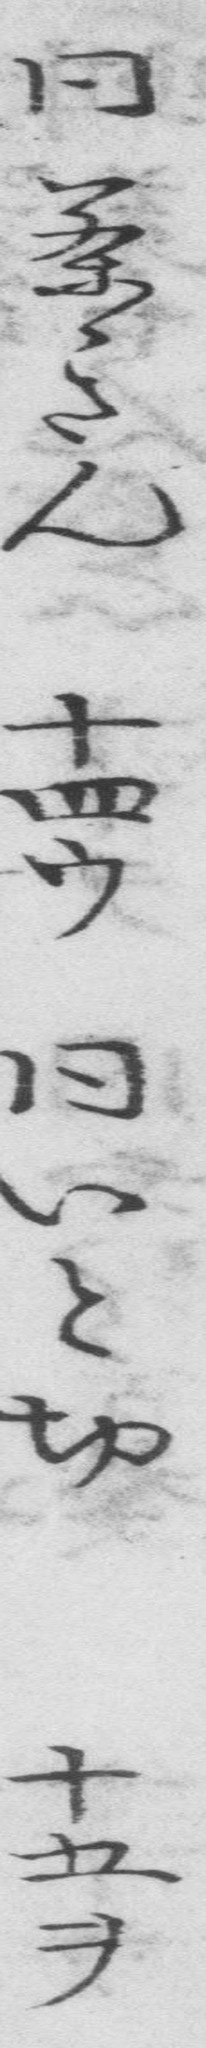同茶きん十四ウ同いと切十五ヲ
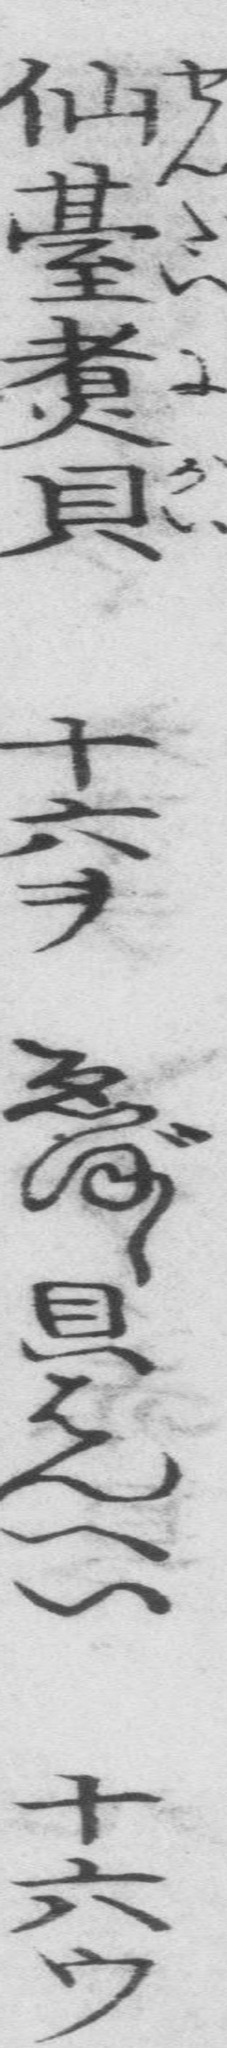仙台煮貝十六ウゑぼし貝はんへい十六ウ
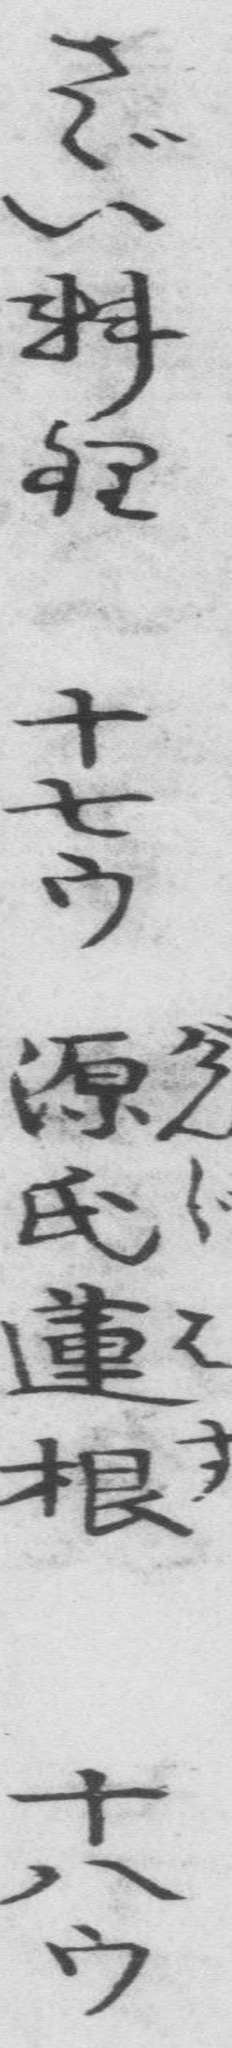さゞい料理十七ウ源氏蓮根十八ウ
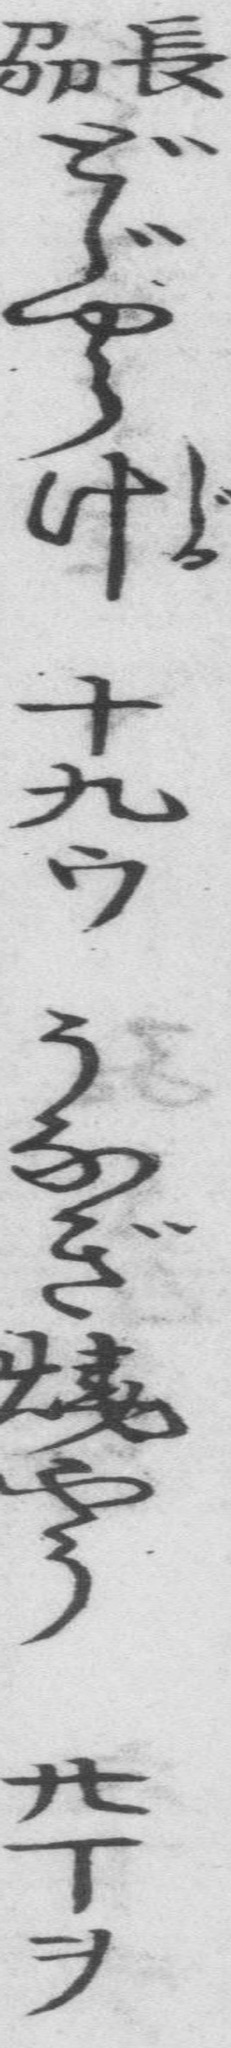長州どじやう汁十九ウうなぎ焼やう廿丁ヲ
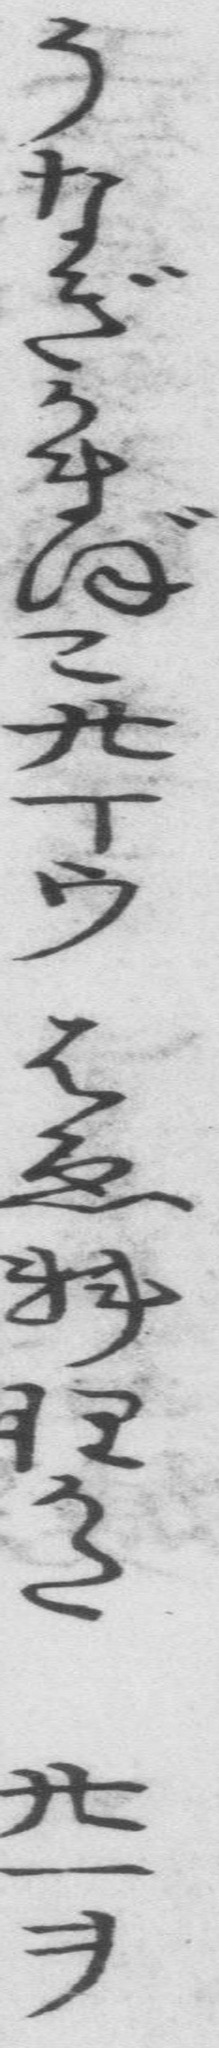うなぎかまぼこ廿丁ウはゑ料理かた廿一ヲ
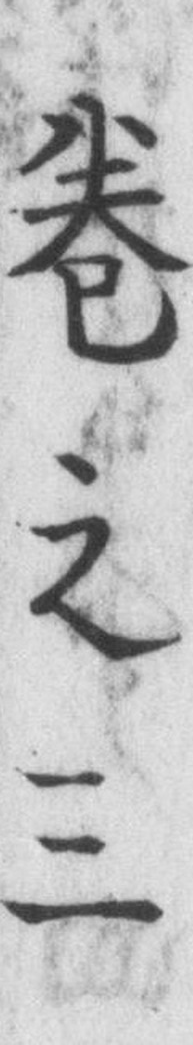巻之三
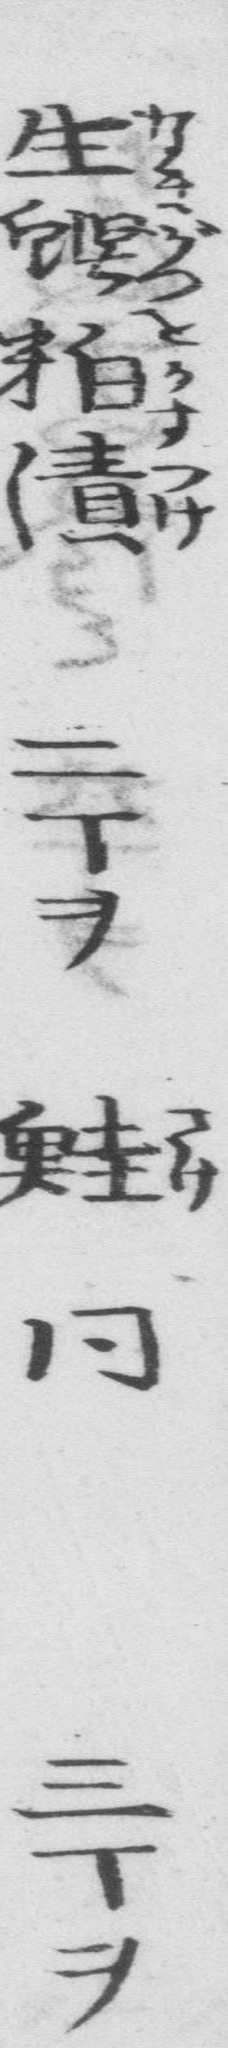生鰹粕漬二丁ヲ鮭同三丁ヲ
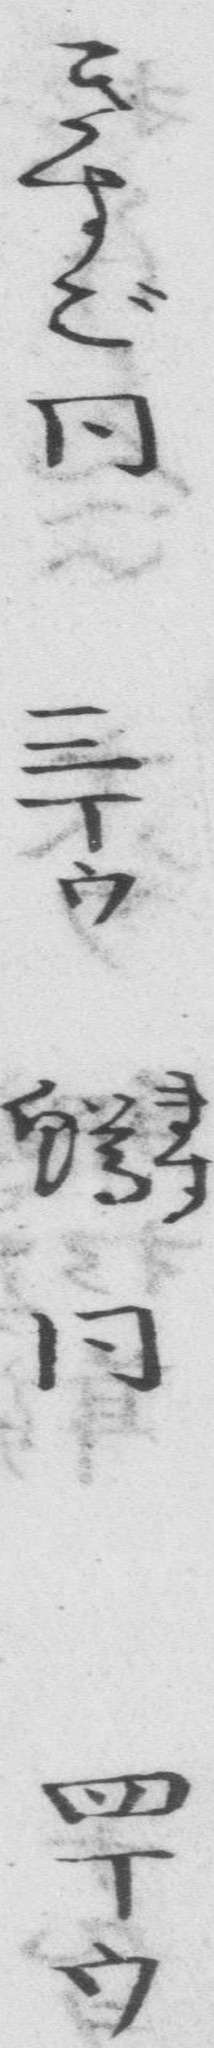きすご同三丁ウ鱒同四丁ウ
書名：萬寳料理秘密箱
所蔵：大阪府立大学学術情報センター 国文学研究資料館
